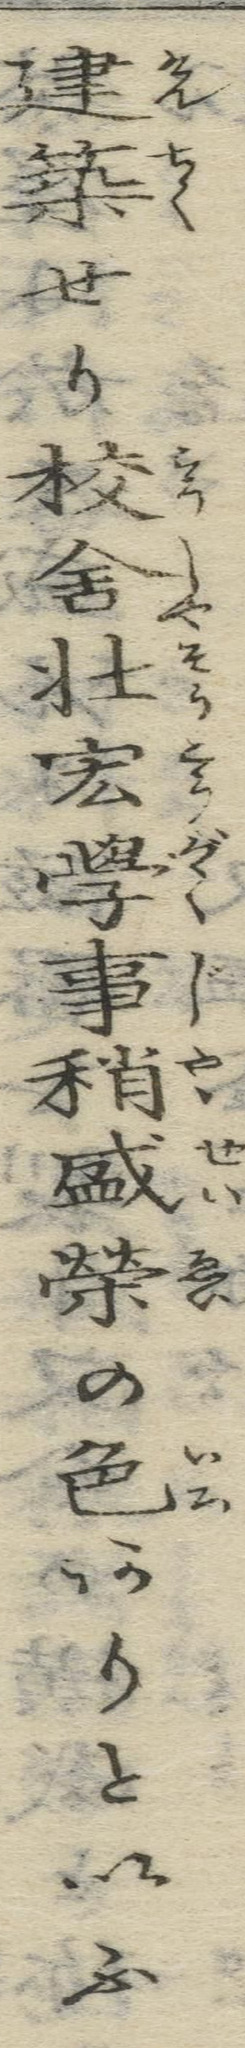建築せり校舎荘宏学事稍盛栄の色ありといふ
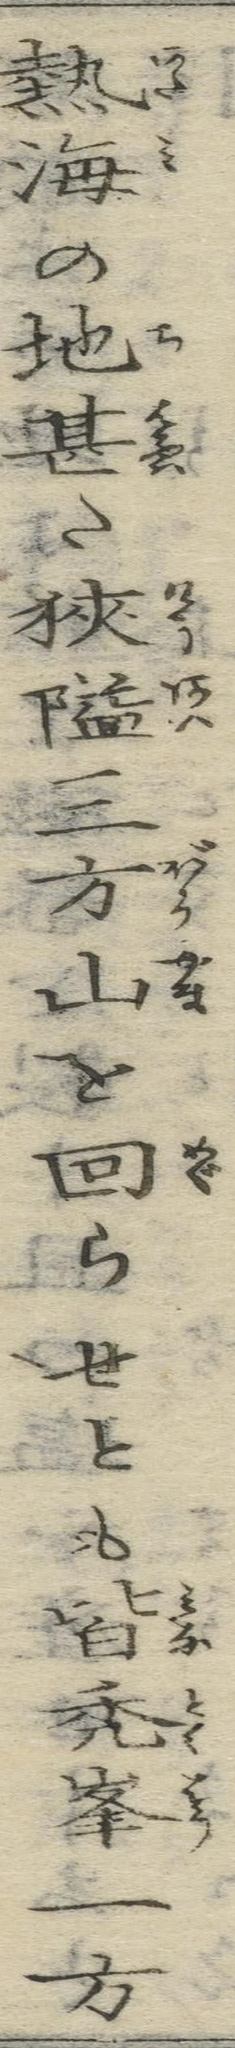熱海の地甚た狭隘三方山を回らせとも皆禿峯一方
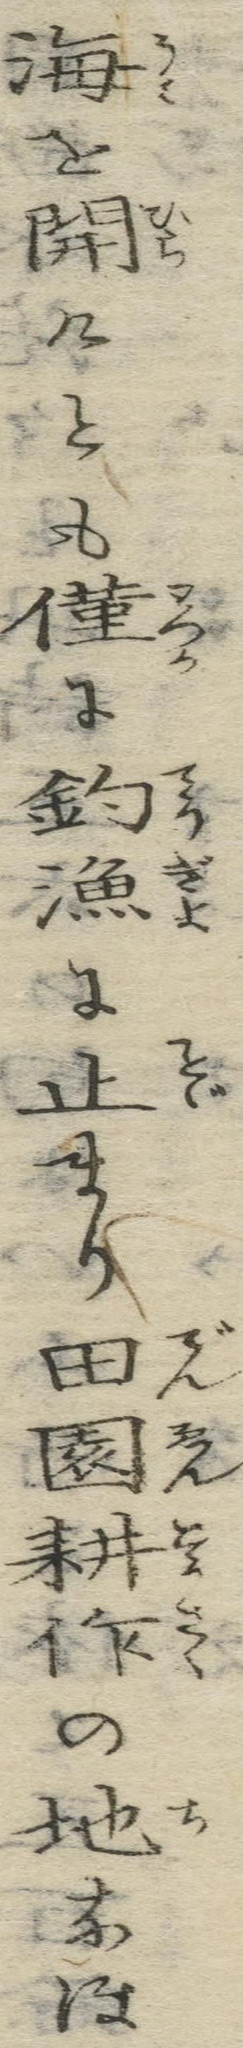海を開けとも僅に釣漁に止まり田園耕作の地なほ
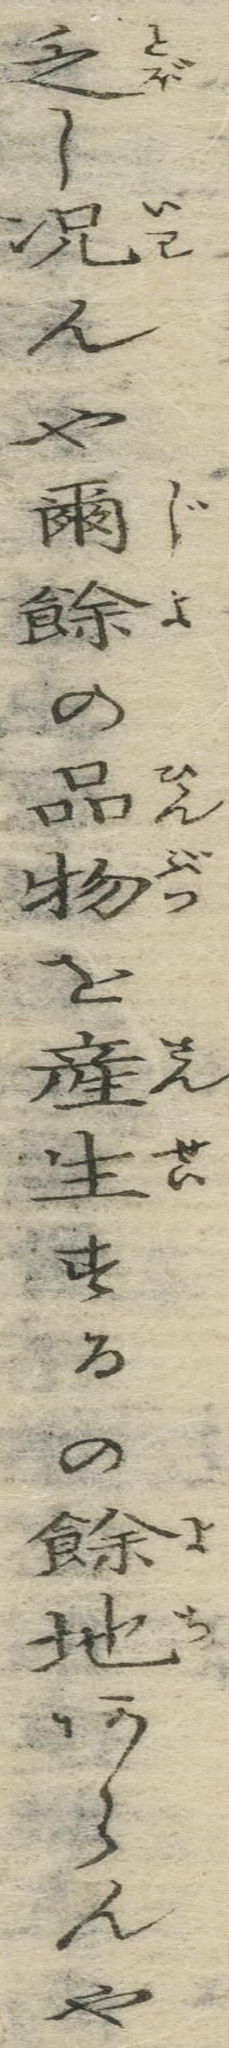乏し況んや爾余の品物を産生するの余地あらんや
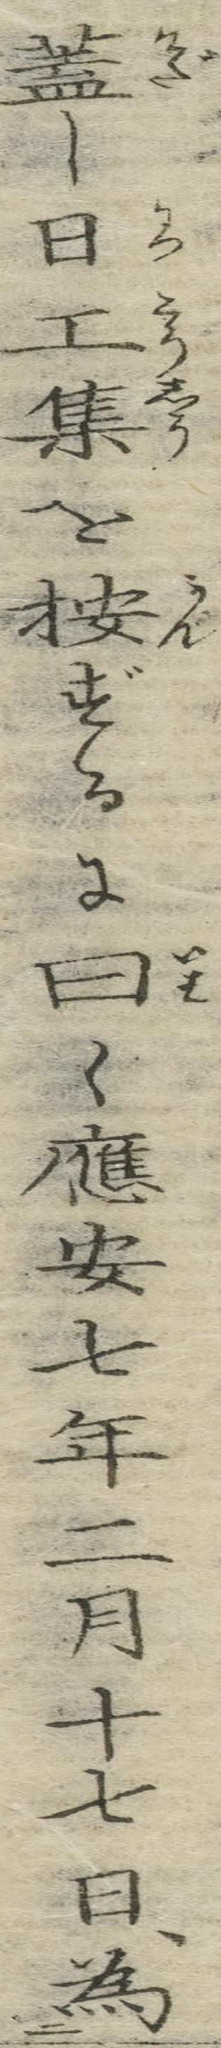蓋し日工集を按ずるに曰く応安七年二月十七日、為

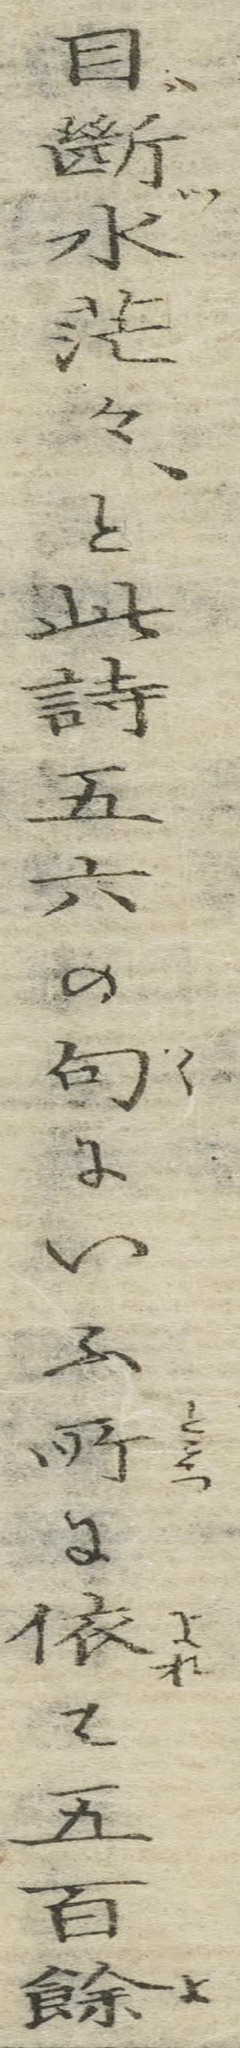目断水茫々、と此詩五六の句にいふ所に依は五百余
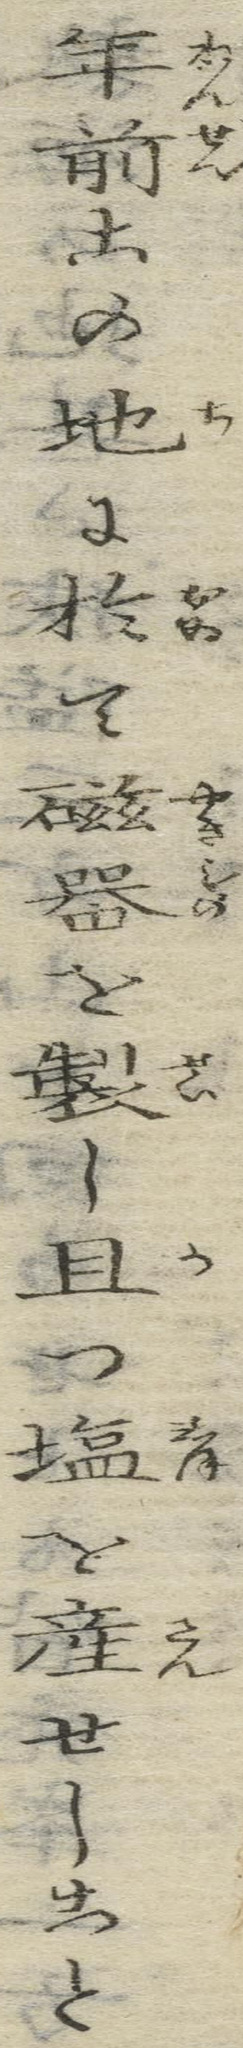年前この地に於て磁器を製し且つ塩を産せしこと
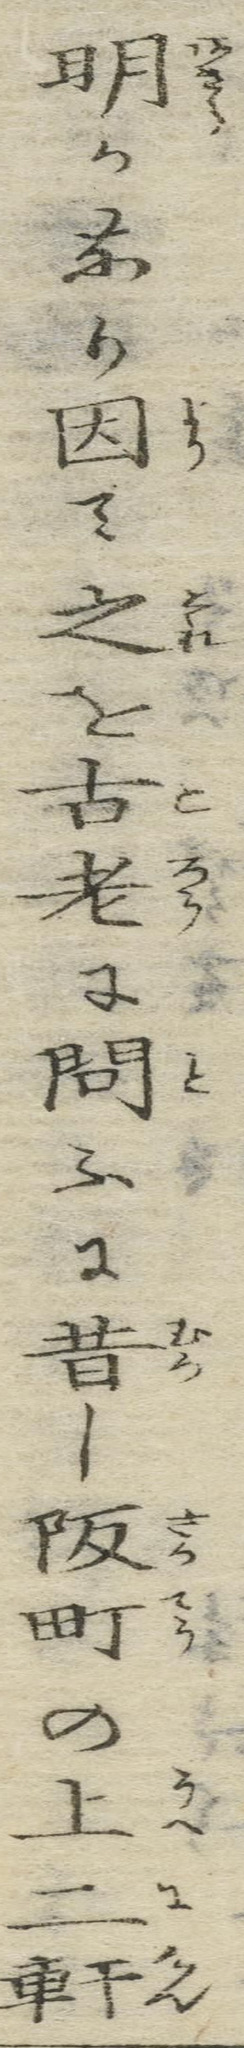明かなり因て之を古老に問ふに昔し阪町の上二軒
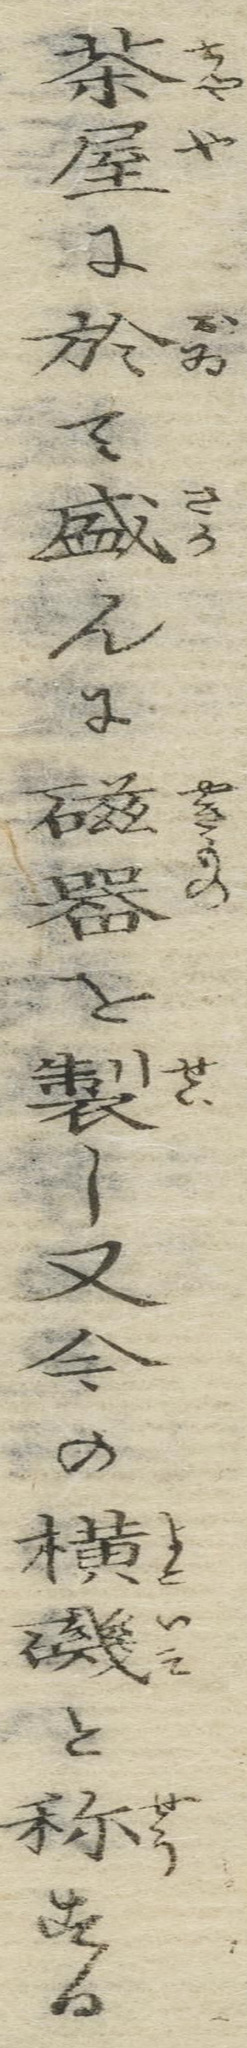茶屋に於て盛んに磁器を製し又今の横磯と称する
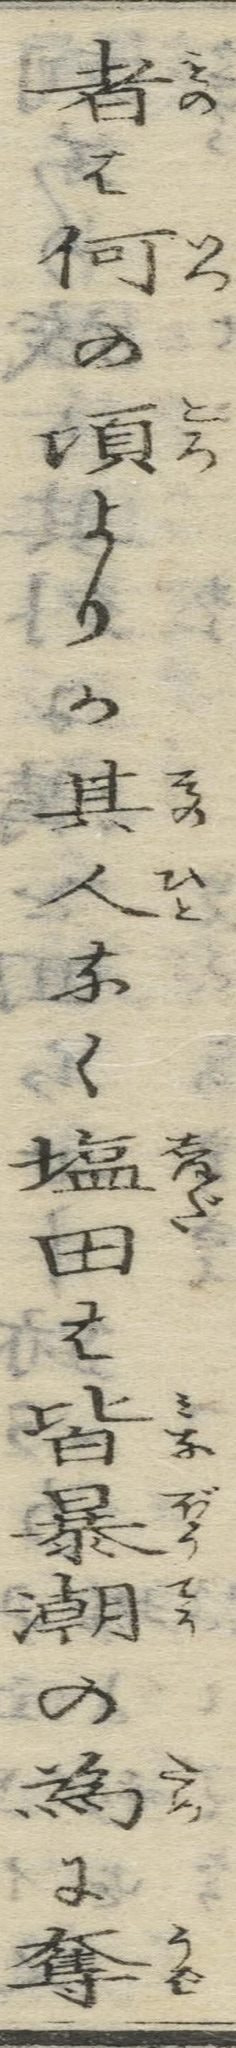者は何の頃よりか其人なく塩田は皆暴潮の為に奪
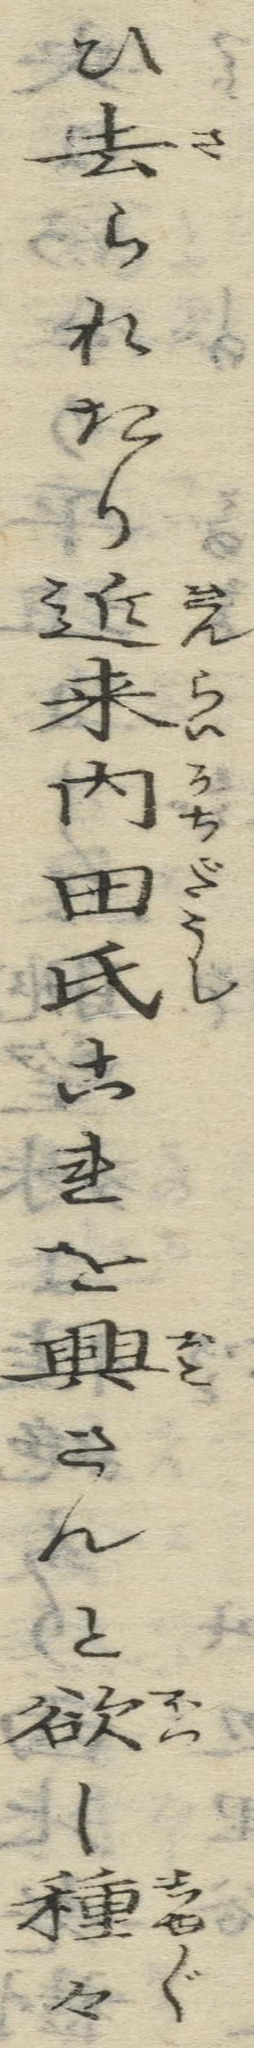ひ去られたり近来内田氏これを興さんと欲し種々
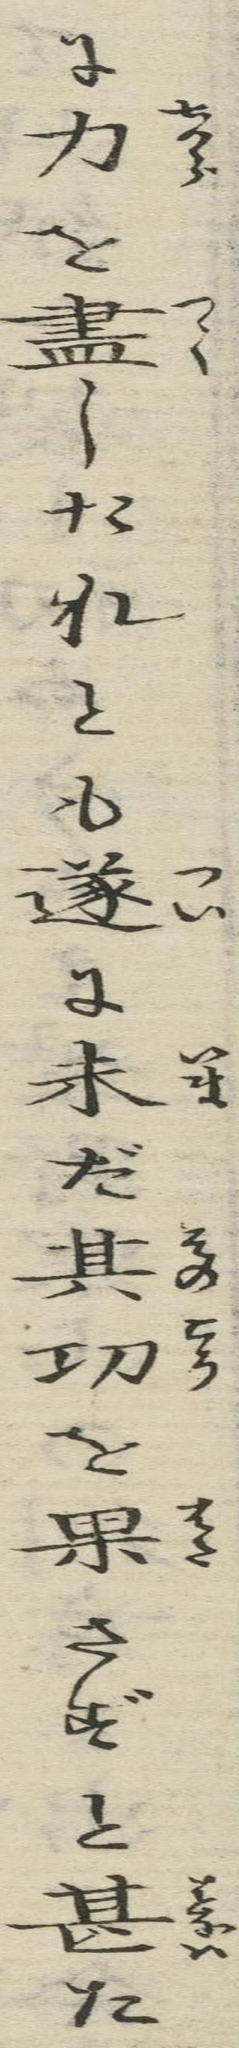に力を尽したれとも遂に未だ其功を果さずと甚た
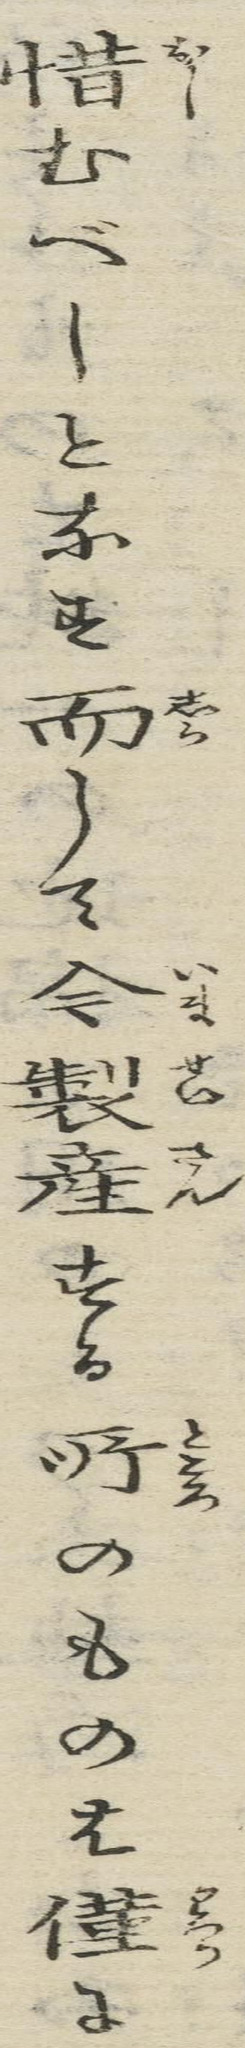惜むべしとなす而して今製産する所のものは僅に
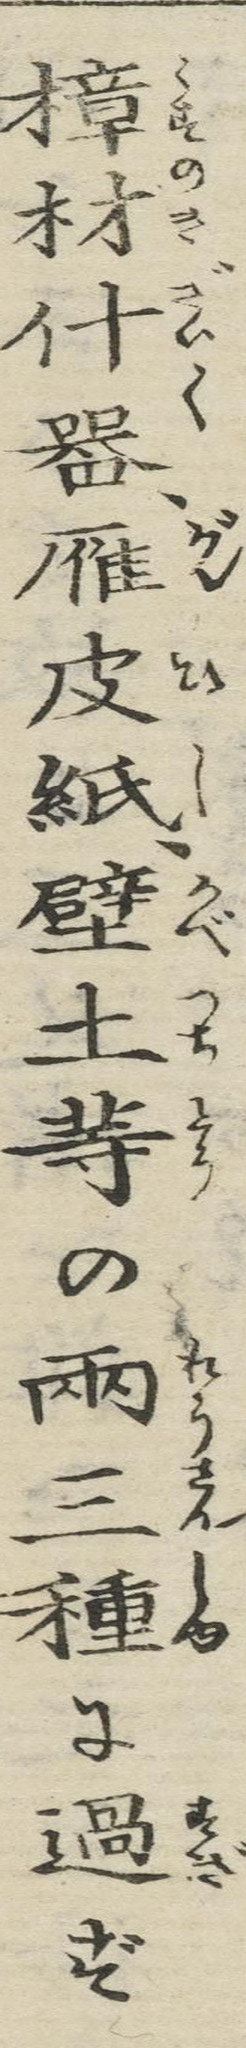樟材什器、雁皮紙、壁土等の両三種に過ず
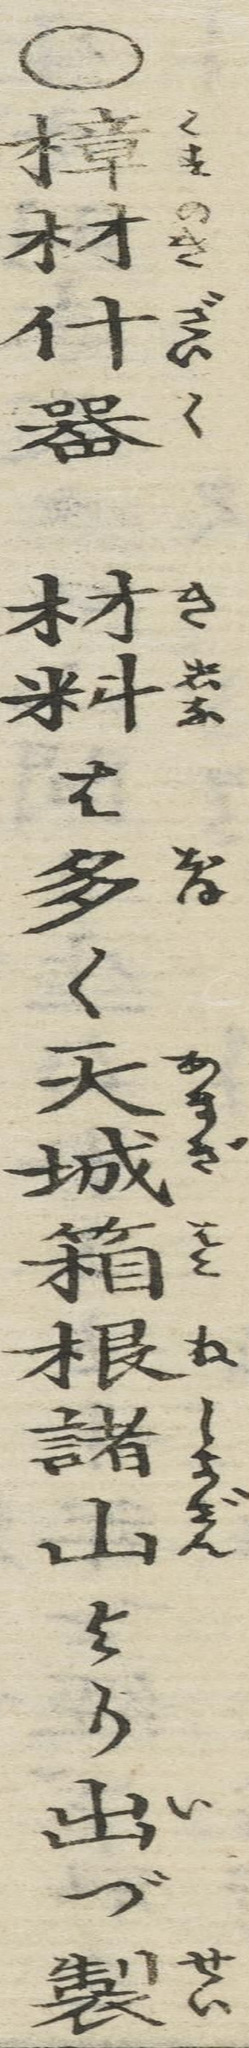○樟材什器材料は多く天城箱根諸山より出づ製
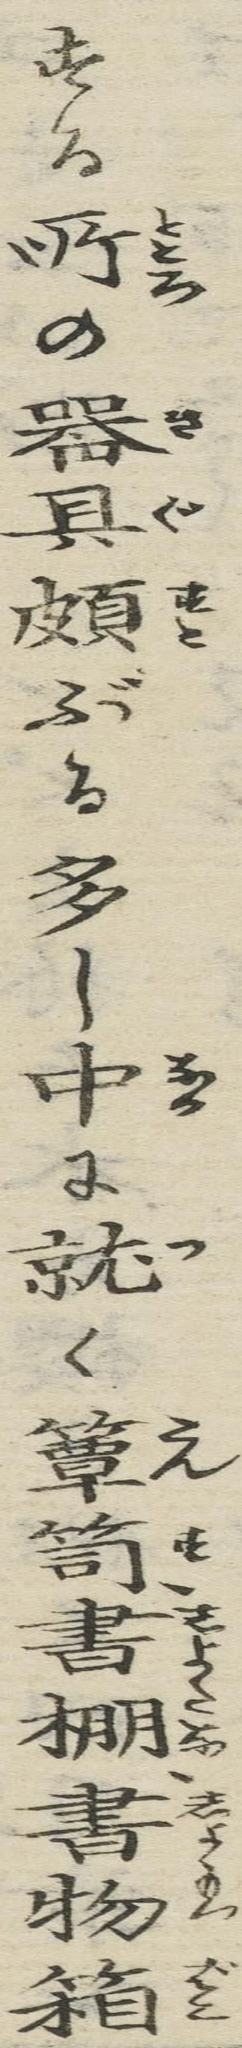する所の器具頗ぶる多し中に就く箪笥、書棚、書物箱
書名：豆州熱海誌　完
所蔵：東京大学地震研究所図書室 Earthquake Research Institute Library, The University of Tokyo, JAPAN
